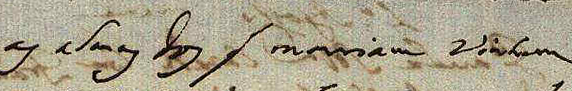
as almas dos q̄ morriam Vinham
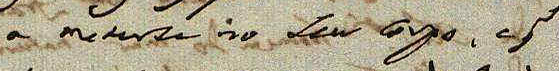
a meterse no seu corpo, e q̄
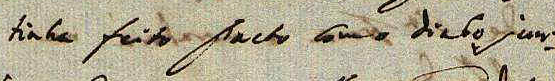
tinha feito pacto como diabo jun
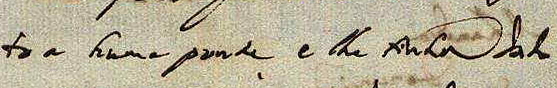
to a huma ponte e lhe tinha dado
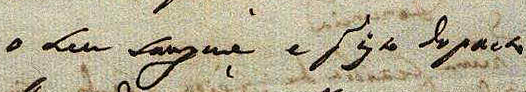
o seu sangue e q̄ isto do pacto
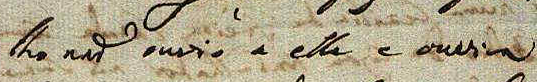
lho naõ ouvio a elle e ouvira
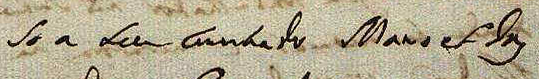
so a seu Cunhado Manoel das
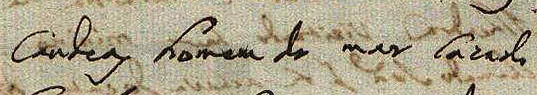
Candeas homem do mar Cazado
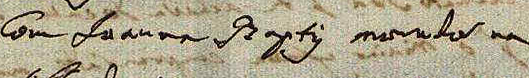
Com Ioanna Baptis morador na
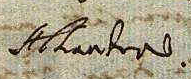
Alhandra.
